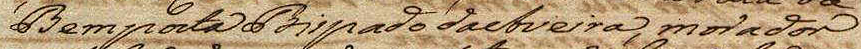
Bemposta Bispado da Aveira, morador
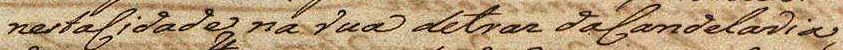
nesta Cidade na rua de traz da Candelaria
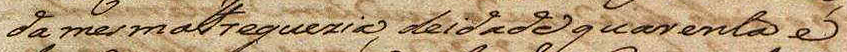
da mesma Freguezia, de idade quarenta e
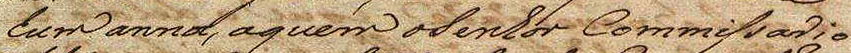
hum annoz, a quem o Senhor Commissario
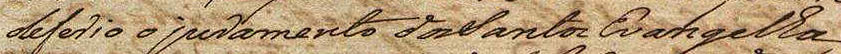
deferio o juramento dos Santos Evangelhos
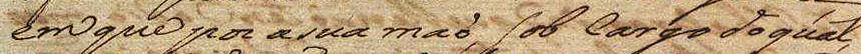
em que poz a sua maõ, sob Cargo do qual,
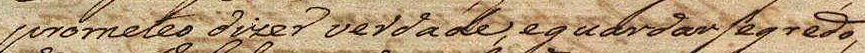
prometeo dizer verdade, e guardar segredo,
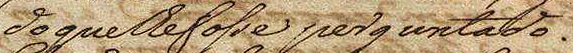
do que lhe fosse perguntado.
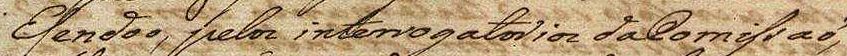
E sendoo, peloz interrogatorioz da Comissaõ,
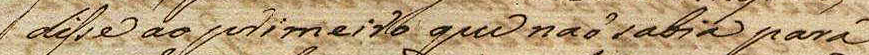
disse ao primeiro que naõ sabia para
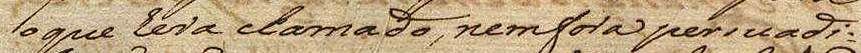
o que hera chamado, nem fora persuadi
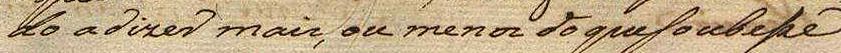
do a dizer maiz, ou menos do que soubesse
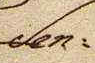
sen
